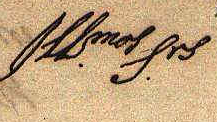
Jll.mos s.rs
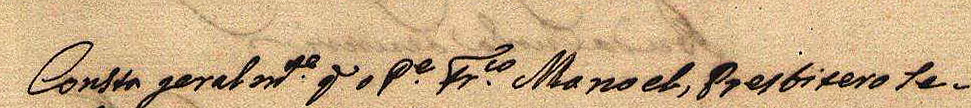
Consta geralm.te q̄ o P.e Fr.co Manoel, Presbitero se
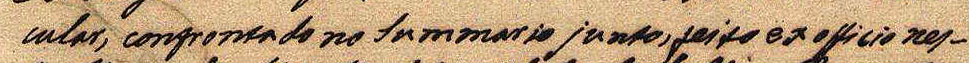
cular, confrontado no summario junto, feito ex officio nes
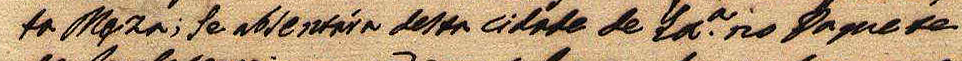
ta Meza; se absentára desta cidade de Lx.a no Paquete
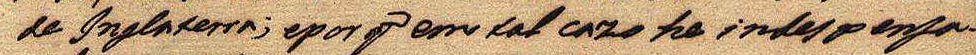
de Inglaterra; e porq̄ em tal cazo he indespensa
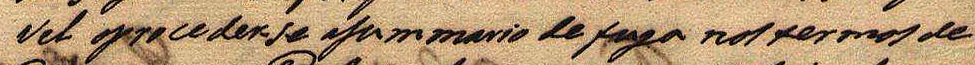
vel o procederse a summario de fuga nos termos de
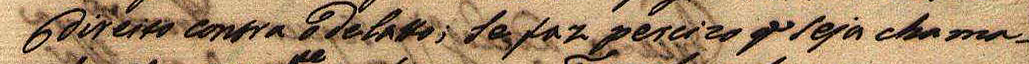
direito contra o delatto; se faz percizo q̄ seja chama
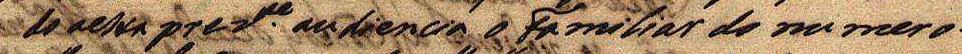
do a esta prez.te audiencia o Familiar do numero
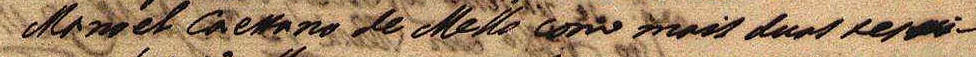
Manoel Caettano de Mello como mais duas testi
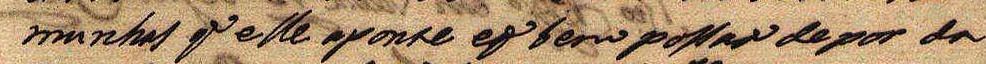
munhas q̄ elle aponte e q̄ bem possaõ depor da
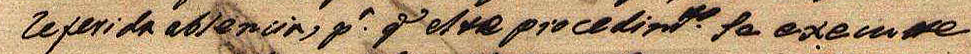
Referida absencia, p.a q̄ este procedim.to se execute
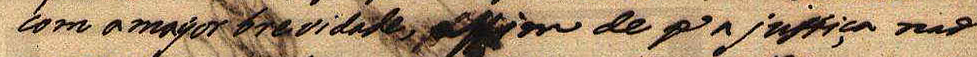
com a mayor brevidade, afim de q̄ a justiça naõ
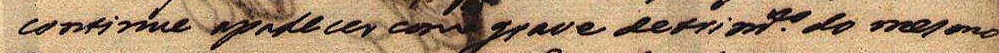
continue a padecer com grave detrim.to do mesmo
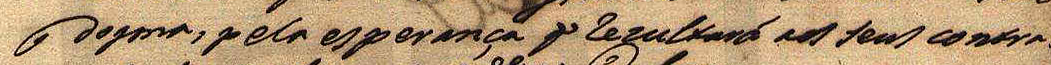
dogma, pela esperança q̄ Rezultará aos seus contra
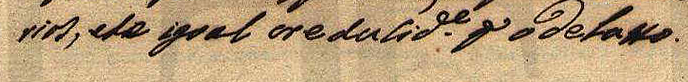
rios, e de igoal credulid.e q̄ o delatto.
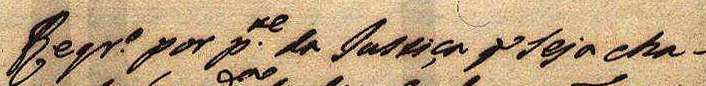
Reqr.o por p.te da Iustiça q̄ seja cha
